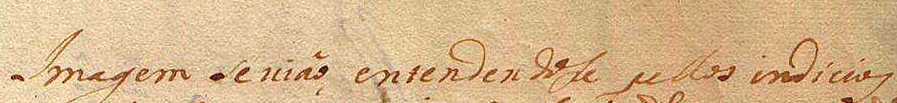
Imagem se uião, entendendose pellos indícios
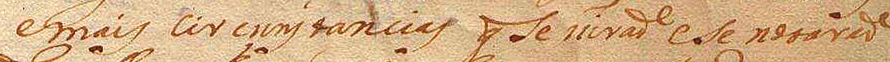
e mais circunstancias q̄ se uiraõ e se notaraõ
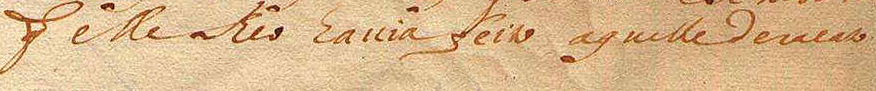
q̄ elle Reo hauia feito aquelle dezacato
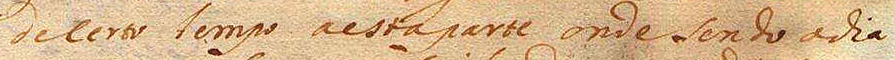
de certo tempo a esta parte onde sendo o dia
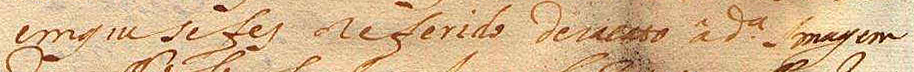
em que se fez o Referido dezacato a d.a Imagem
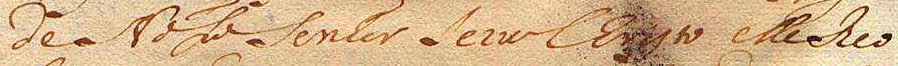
de Nosso Senhor Iezu Christo elle Reo
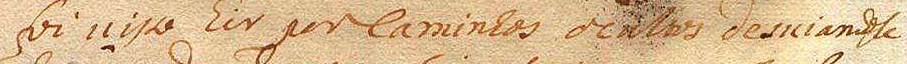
foi uisto hir por caminhos ocultos desuiandose
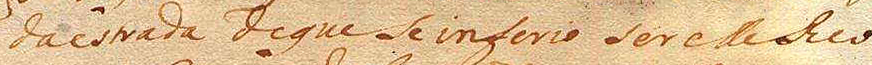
da estrada de que se inferio ser elle Reo
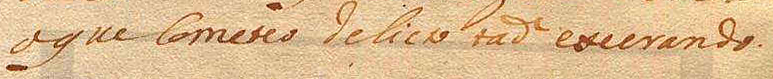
o que cometeo delicto taõ execrando.
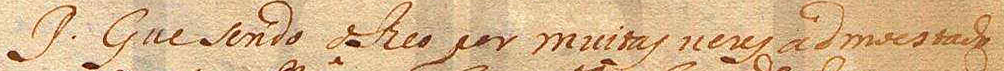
P. Que sendo o Reo por muitas uezes admoestado
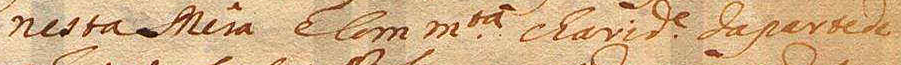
nesta Meza e com m.ta charid.e da parte de
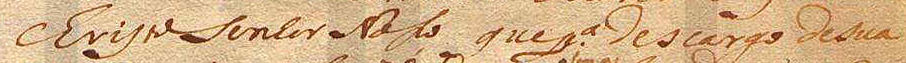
christo senhor Nosso, que p.a descargo de sua
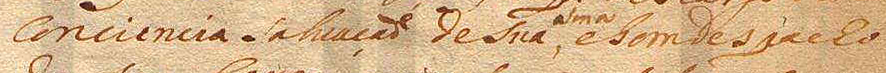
conciencia saluaçaõ de sua, alma e bom despacho
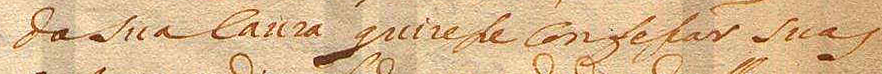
da sua cauza quizesse confessar suas
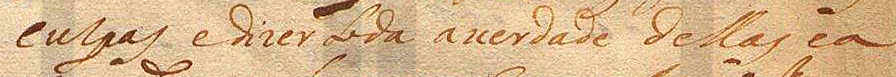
culpas e dizer toda a uerdade dellas e a
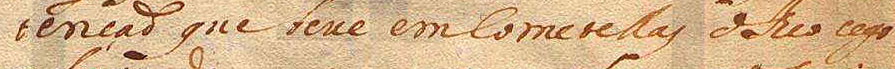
tençaõ que teue em cometellas o Reo cego
